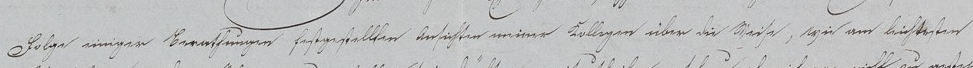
Folge einiger Berathungen festgestellten Ansichten meiner Kollegen über die Weise, wie am leichtesten
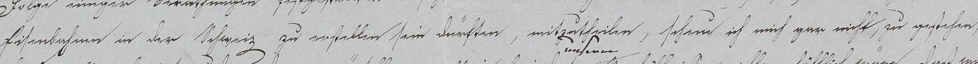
Eisenbahnen in der Schweiz zu erstellen sein dürften, mitzutheilen, scheue ich mich gar nicht, zu gestehen,
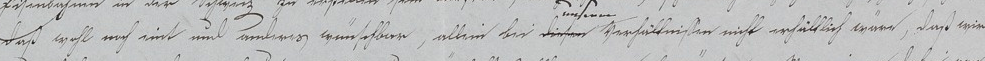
daß wohl noch eint und anderes wünschbar, allein bei diesenunseren Verhältnissen nicht erhältlich wäre, daß wir
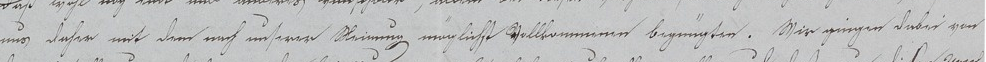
uns daher mit dem nach unserer Meinung möglichst Vollkommenen begnügten. Wir gingen dabei von
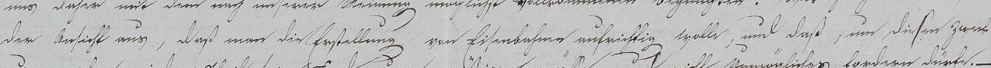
der Ansicht aus, daß man die Erstellung von Eisenbahnen aufrichtig wolle, und daß, um diesen Zweck
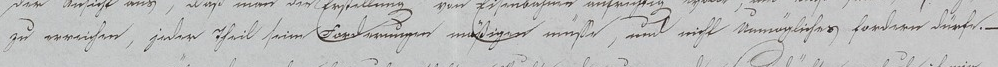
zu erreichen, jeder Theil seine Forderungen mäßigen müsse, und nicht Unmögliches fordern dürfe. –
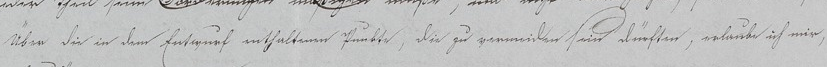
Über die in dem Entwurf enthaltenen Punkte, die zu vermeiden sein dürften, erlaube ich mir,
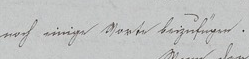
noch einige Worte beizufügen.
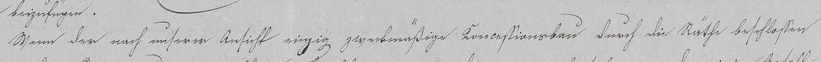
Wenn der nach unserer Ansicht einzig zweckmäßige Koncessionsbau durch die Räthe beschlossen
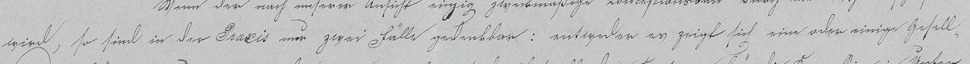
wird, so sind in der Praxis nur zwei Fälle gedenkbar: entweder es zeigt sich eine oder einige Gesell-
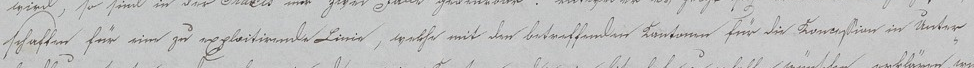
schaften für eine zu exploitirende Linie, welche mit den betreffenden Kantonen für die Koncession in Unter-
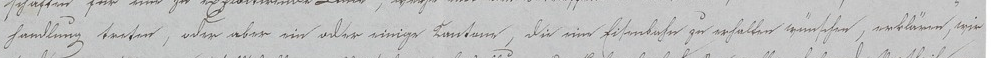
handlung treten, oder aber ein oder einige Kantone, die eine Eisenbahn zu erhalten wünschen, erklären, wir
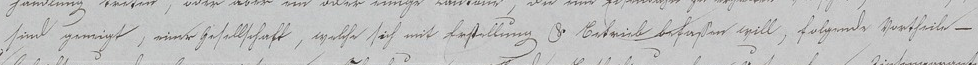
sind geneigt, einer Gesellschaft, welche sich mit Erstellung & Betrieb befassen will, folgende Vortheile –
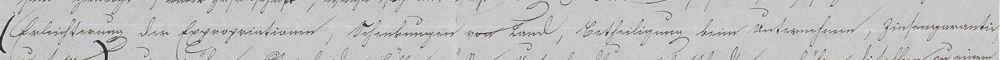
(Erleichterung der Expropriationen, Schenkungen von Land, Betheiligung beim Unternehmen, Zinsengarantie,
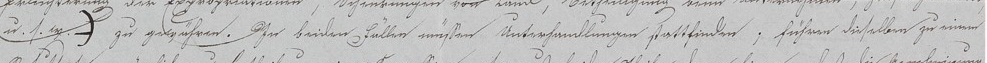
u. s. w. – ) zu gewähren. In beiden Fällen müssen Unterhandlungen stattfinden; führen dieselben zu einem
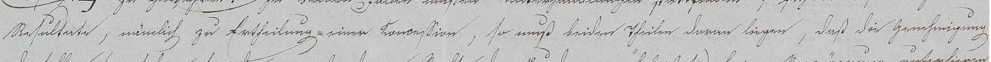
Resultate, nämlich zu Ertheilung einer Koncession, so muß beiden Theilen daran liegen, daß die Genehmigung
